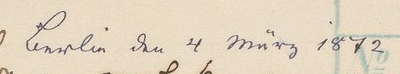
Berlin den 4 März 1872.
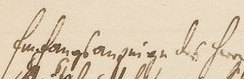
Hochgeehrter Herr
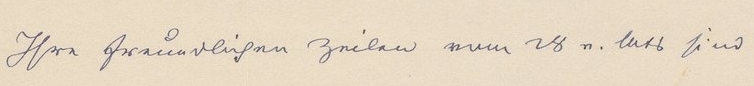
Ihre freundlichen Zeilen vom 28 v. Mts sind
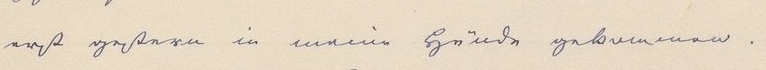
erst gestern in meine Hände gekommen.
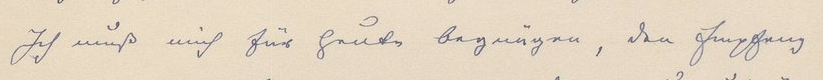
Ich muß mich für heute begnügen, den Empfang
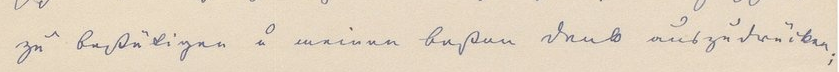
zu bestätigen u meinen besten Dank auszudrücken;
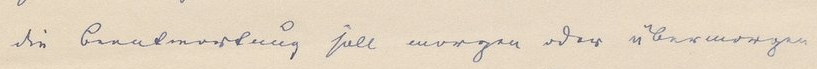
die Beantwortung soll morgen oder übermorgen
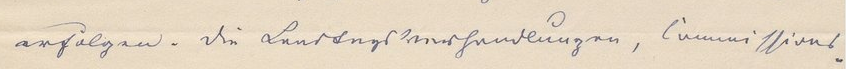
erfolgen. Die Landtagsverhandlungen, Commissions-
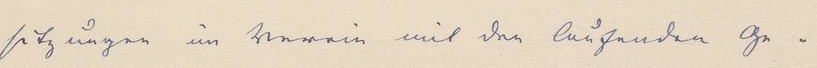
sitzungen im Verein mit den laufenden Ge-
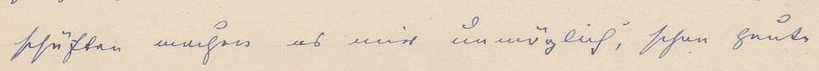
schäften machen es mir unmöglich, schon heute
